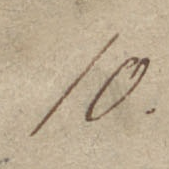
10.
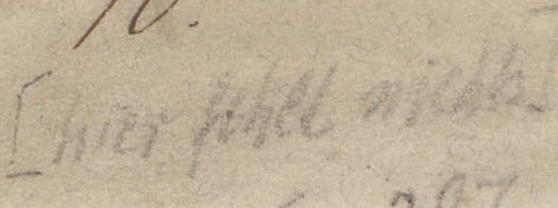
richtungen, sie
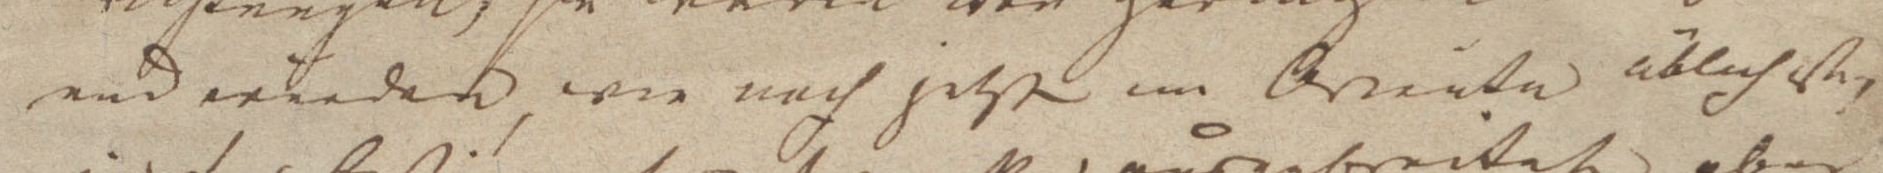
und wurden, wie noch jetzt im Oriente üblich ist,
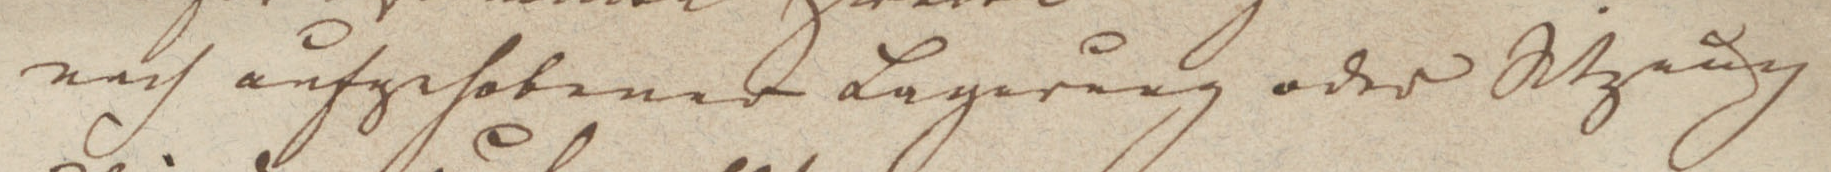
nach aufgehobener Lagerung oder Sitzung
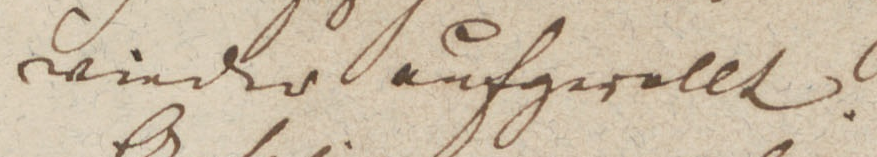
wieder aufgerollt.
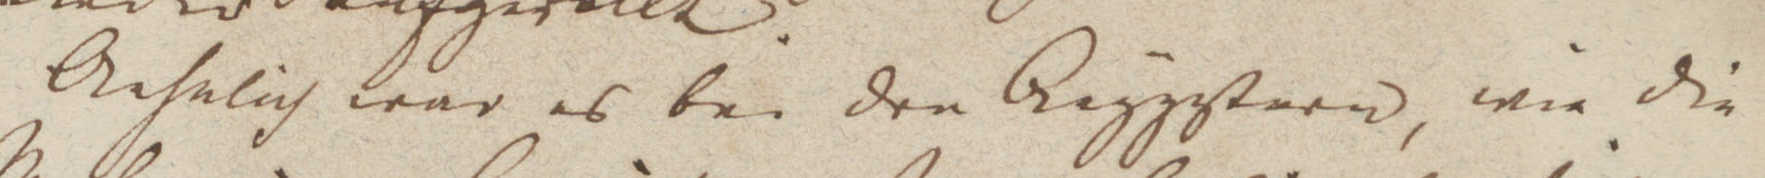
Aehnlich war es bei den Aegyptern, wie die
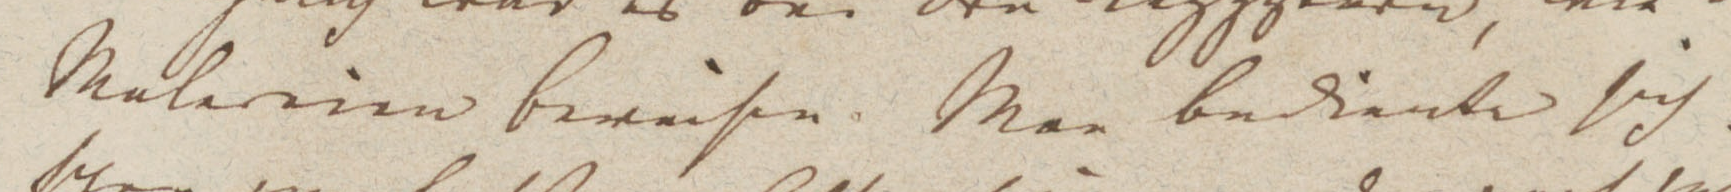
Malereien beweisen. Man bediente sich
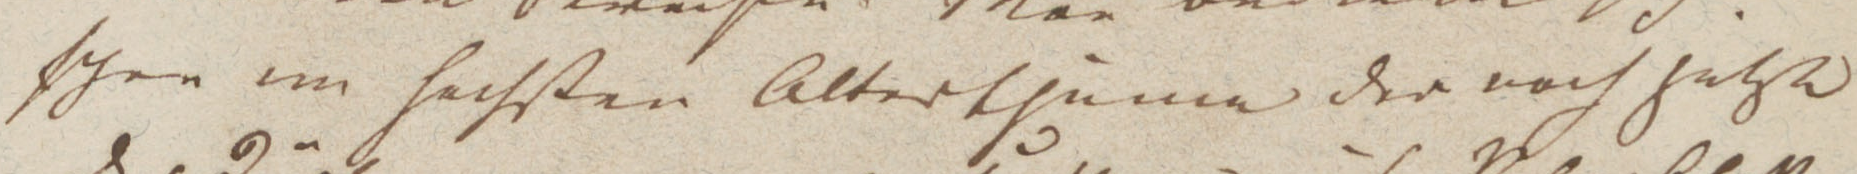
schon im hochsten Alterthume der noch jetzt
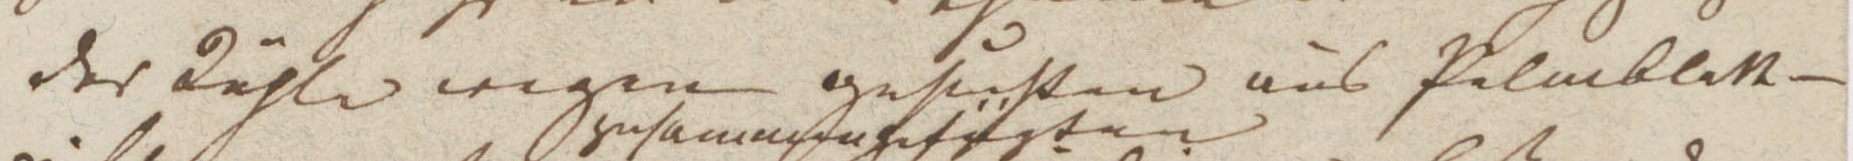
der Kühle wegen gesuchten aus Palmblatt-
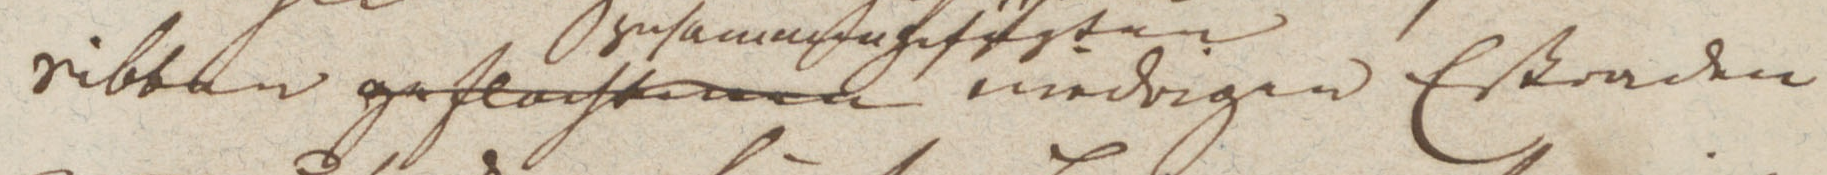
ribben geflochtenen zusammengefügten niedrigen Estraden
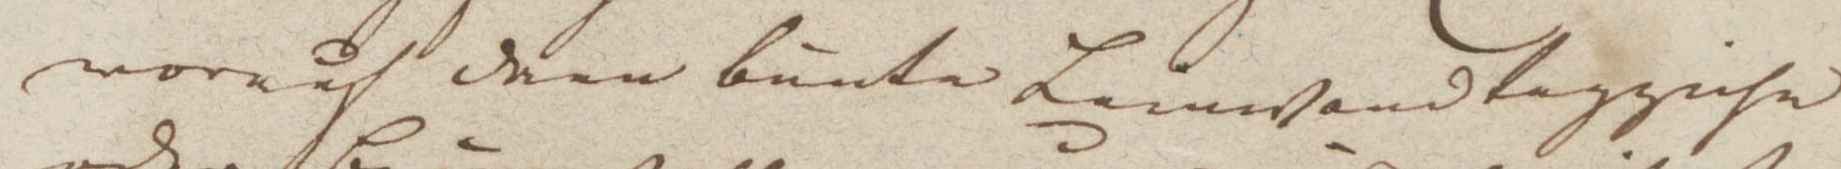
worauf dann bunte Leinwandteppiche
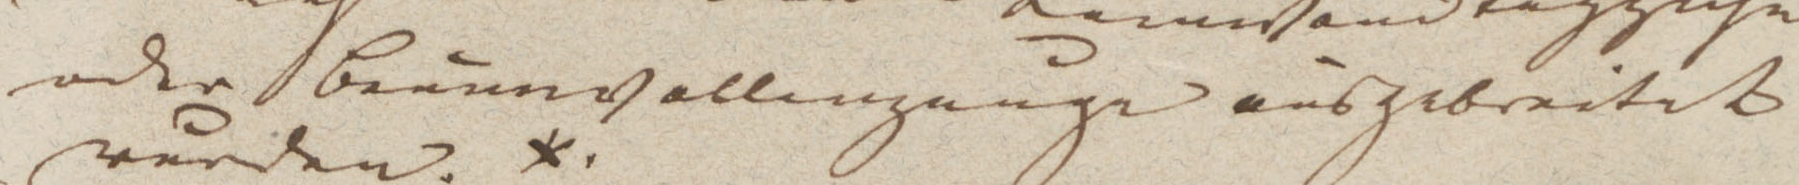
oder Baumwollenzeuge ausgebreitet
